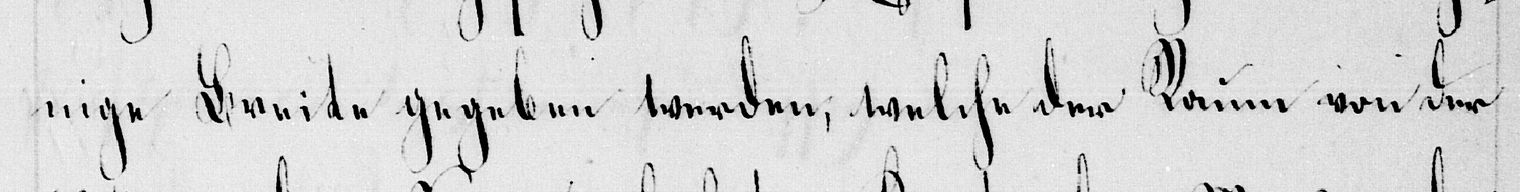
nige Breite gegeben werden, welche der Raum von der
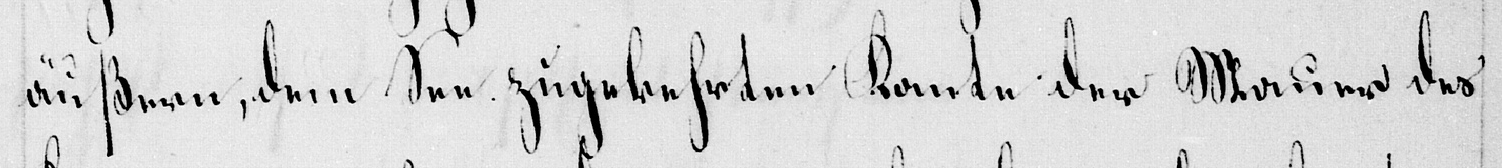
äußern, dem See zugekehrten Kante der Mauer des
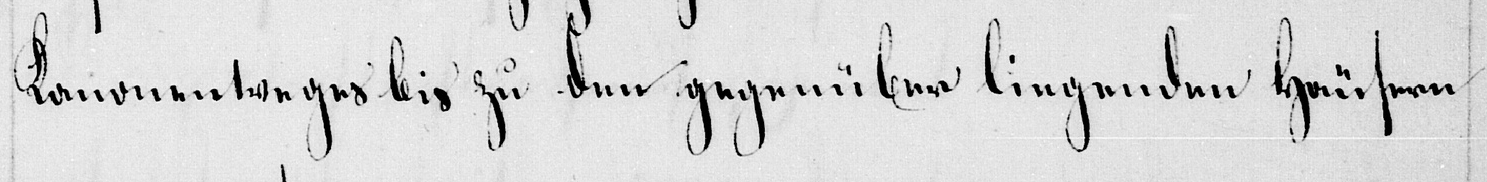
Kanonenweges bis zu den gegenüber liegenden Häusern
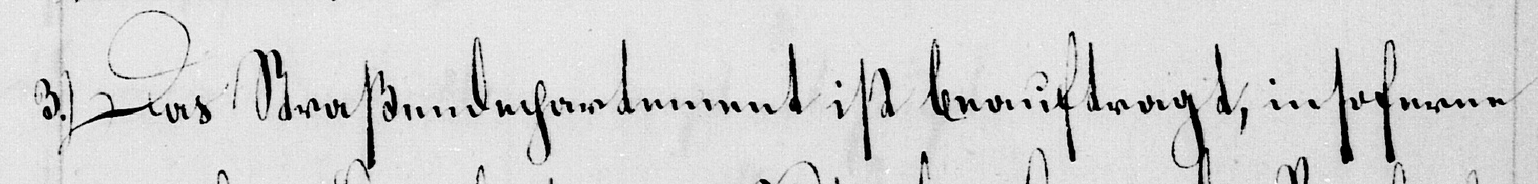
3.) Das Straßendepartement ist beauftragt, insoferne
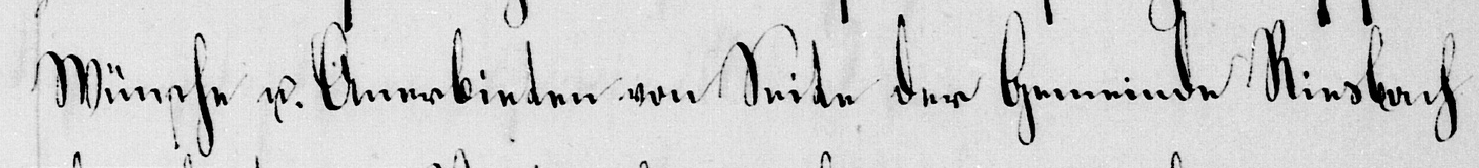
Wünschen u. Anerbieten von Seite der Gemeinde Riesbach
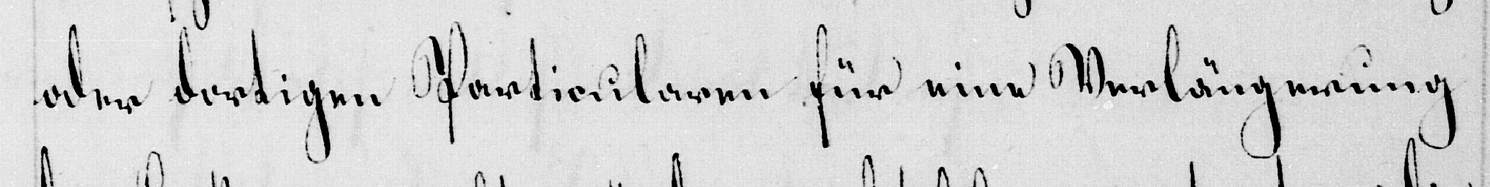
oder dortigen Particularen für eine Verlängerung
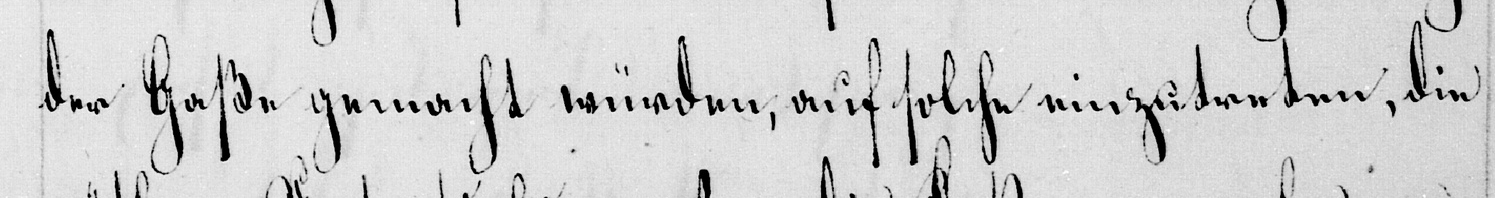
der Gaße gemacht würden, auf solche einzutreten, die
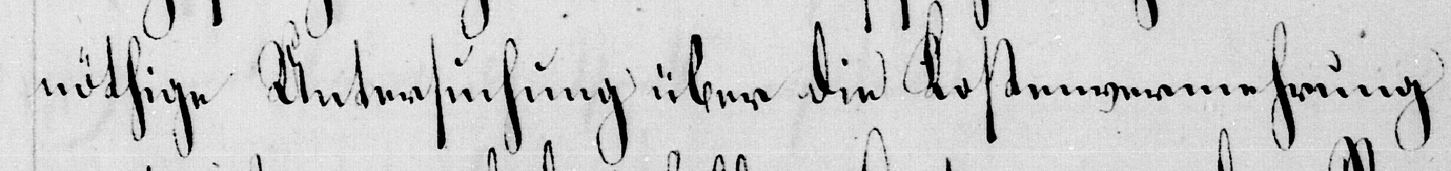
nöthige Untersuchung über die Kostenvermehrung
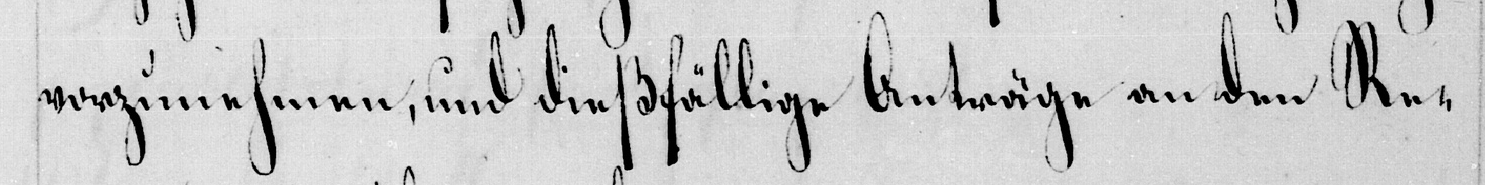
vorzunehmen, und dießfällige Anträge an den Re¬
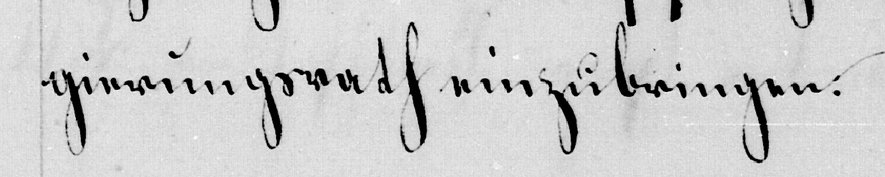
gierungsrath einzubringen.
